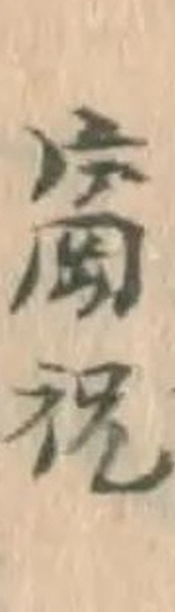片岡祝
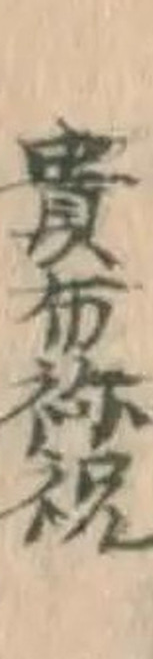貴布祢祝
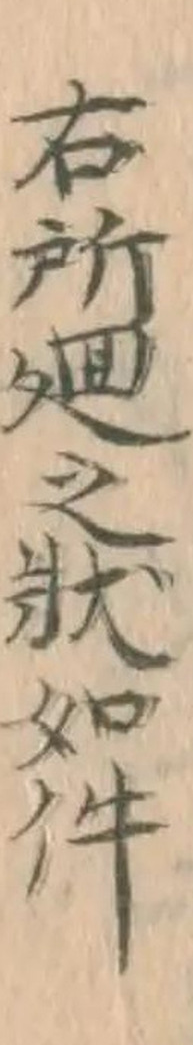右所廻之状如件
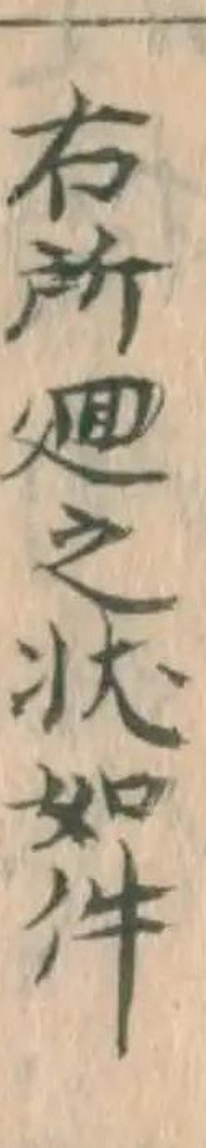右所廻之状如件
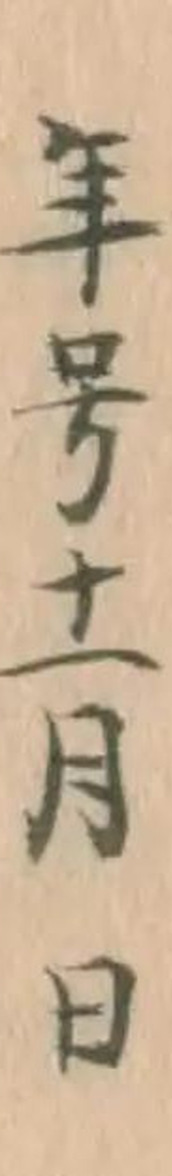年号十一月日
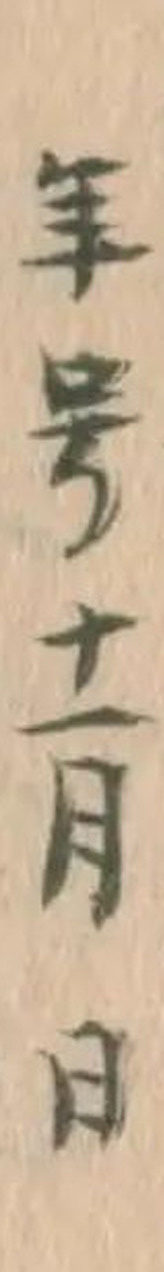年号十一月日
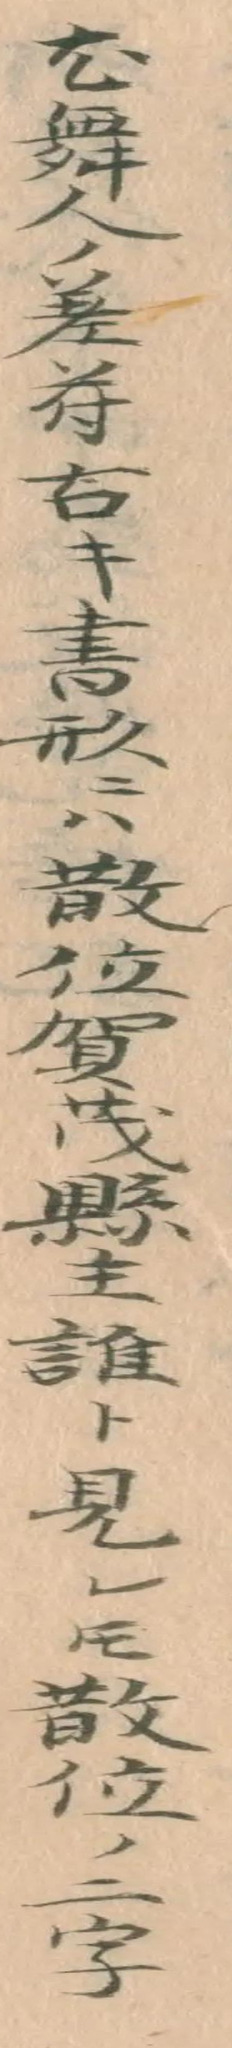尤舞人ノ差符古キ書形ニハ散位賀茂縣主誰ト見レトモ散位ノ二字
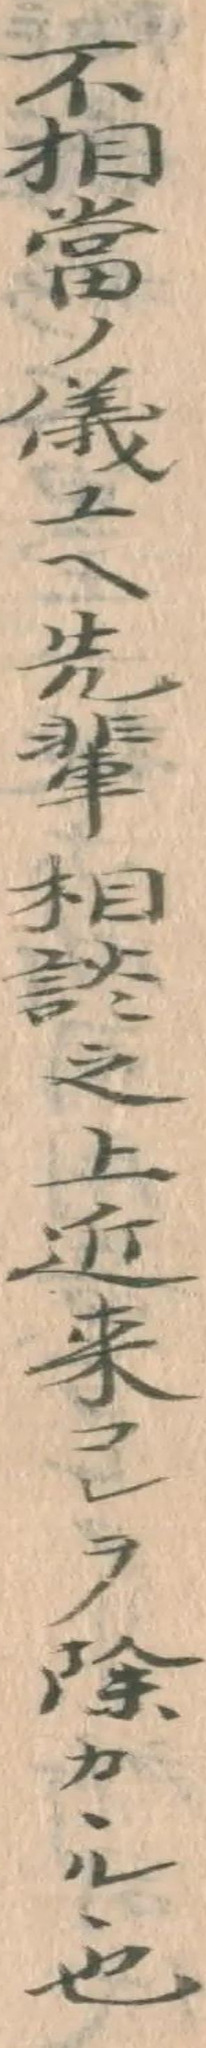不相當ノ儀ユヘ先輩相談之上近来コレヲ除カルヽ也
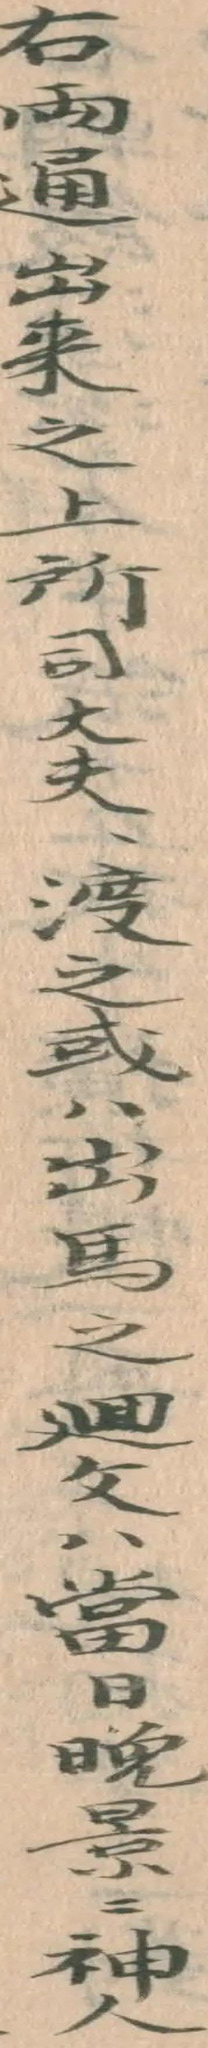右両通出来之上所司大夫へ渡之或ハ出馬之廻文ハ當日晩景ニ神人
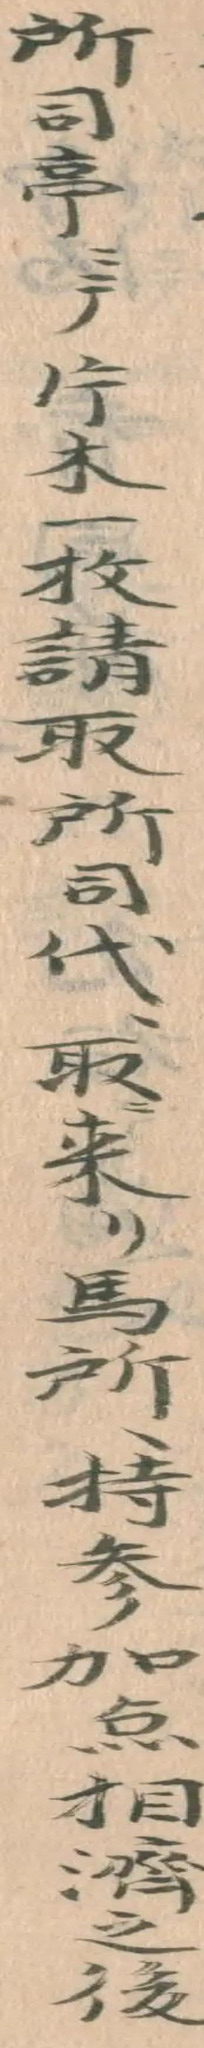所司亭にニテ片木一枚請取所司代へ取ニ来リ馬所ヘ持参加点相済之後
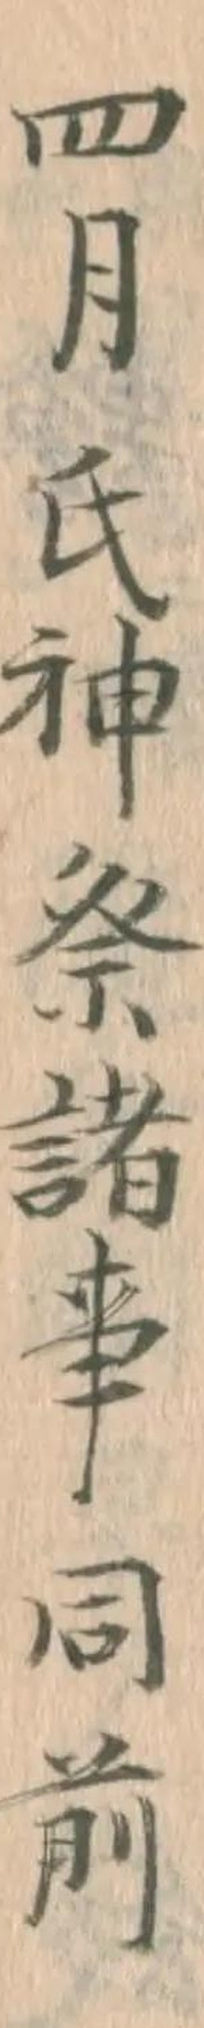四月氏神祭諸事同前
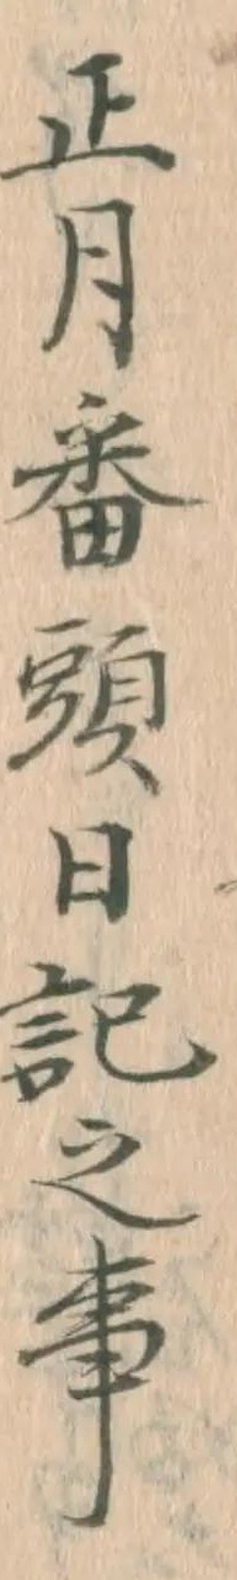正月番頭日記之事
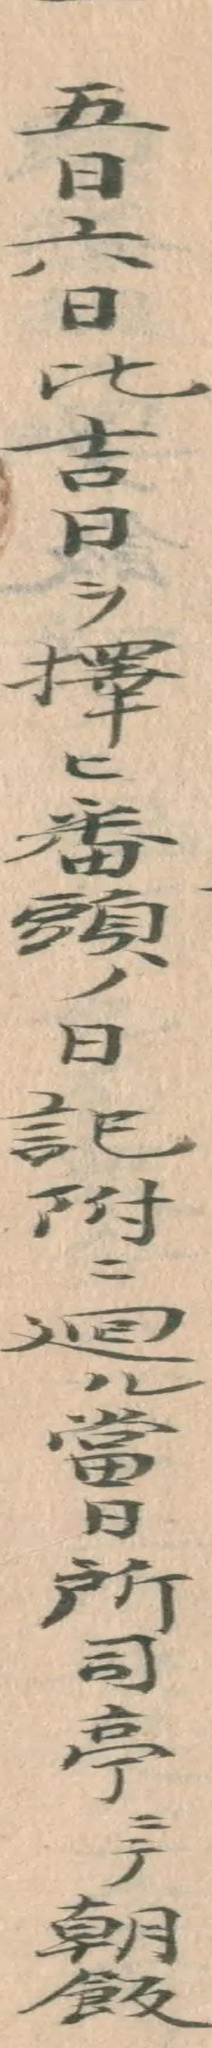一五日六日比吉日ヲ擇ヒ番頭ノ日記附ニ廻ル當日所司亭ニテ朝飯
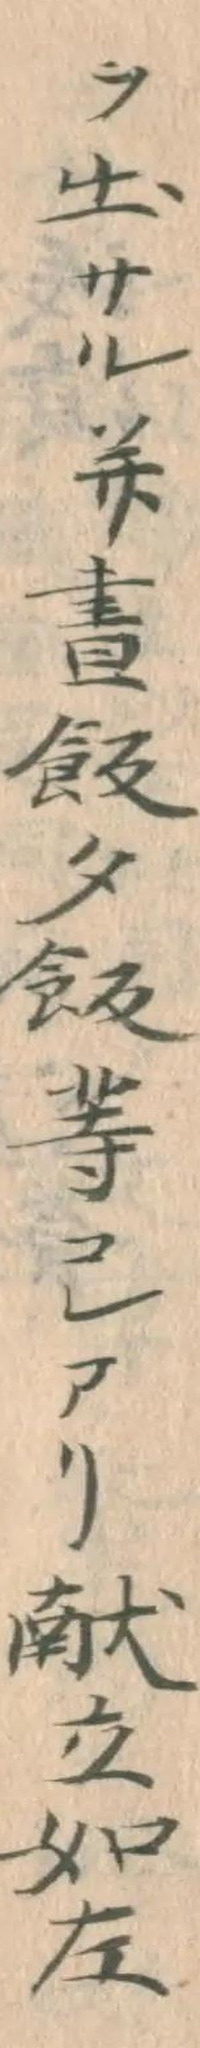ヲ出サル并に昼飯夕飯等コレアリ献立如左

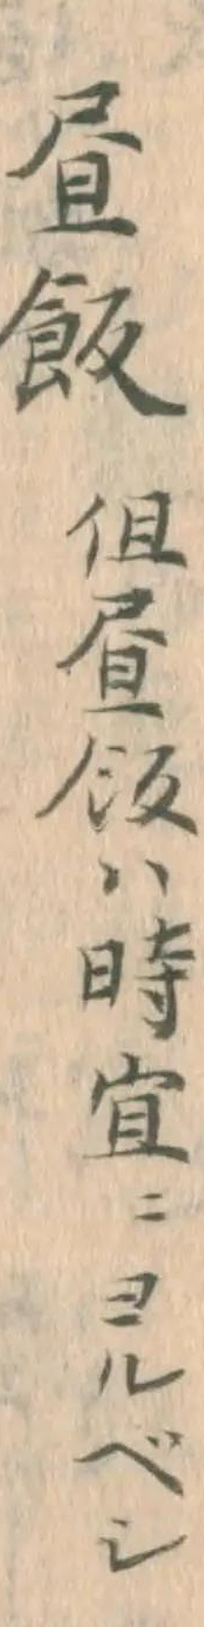昼飯但昼飯ハ時宜ニヨルベシ
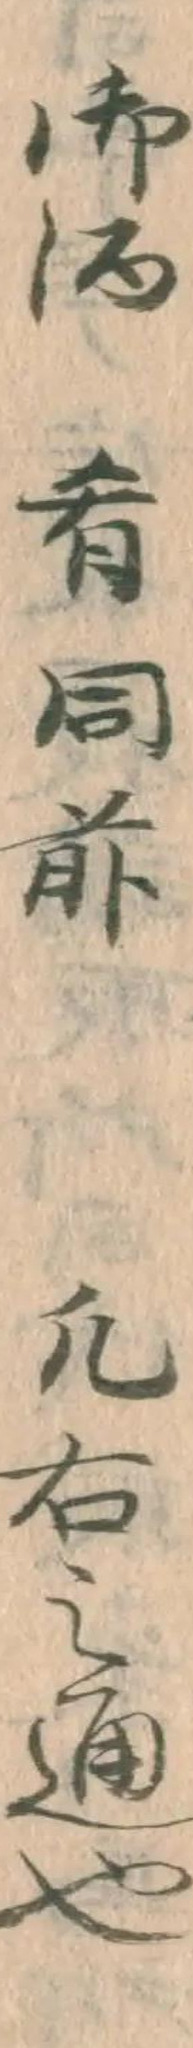御酒肴同前凡右之通也
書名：賀茂社記録. 第40冊
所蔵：国立国会図書館 National Diet Library, JAPAN
